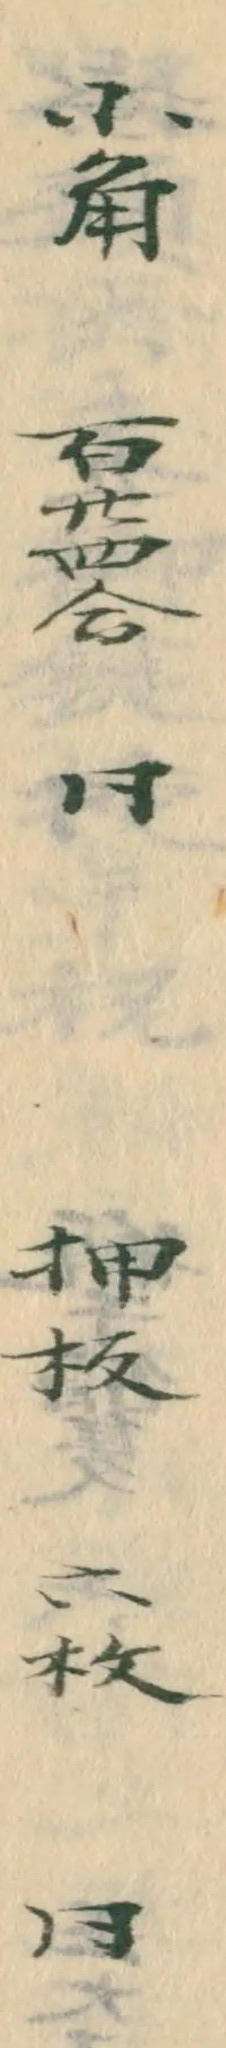小角百廿四合同押板六枚同
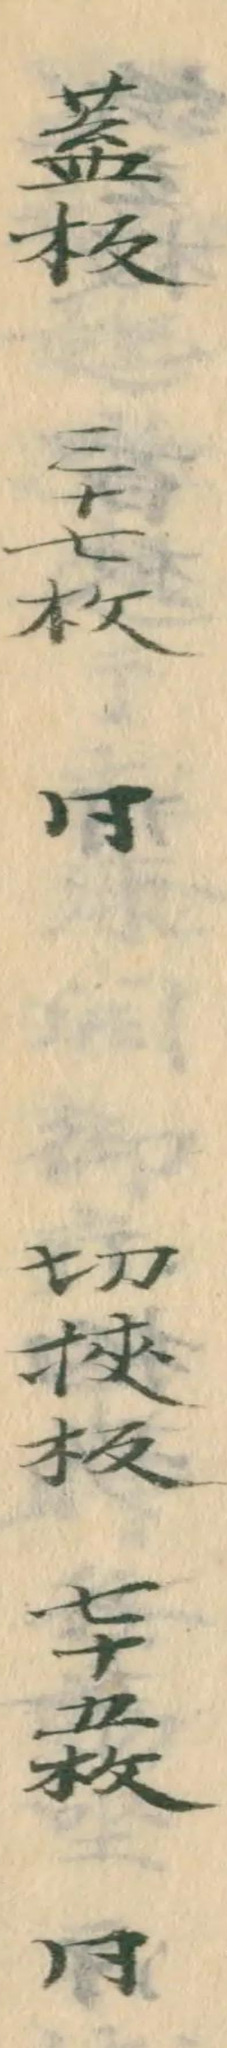蓋板三十七枚同切挟板七十五枚同

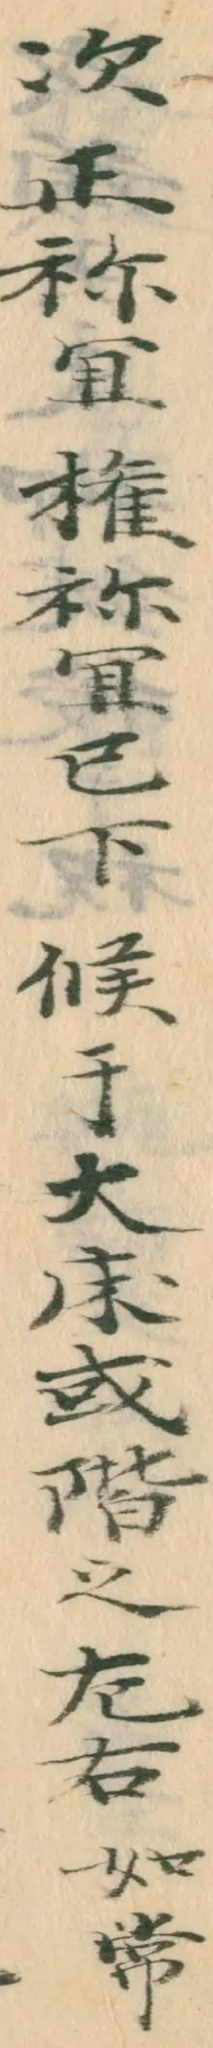次正禰宜権禰宜已下候于大床或階之左右如常

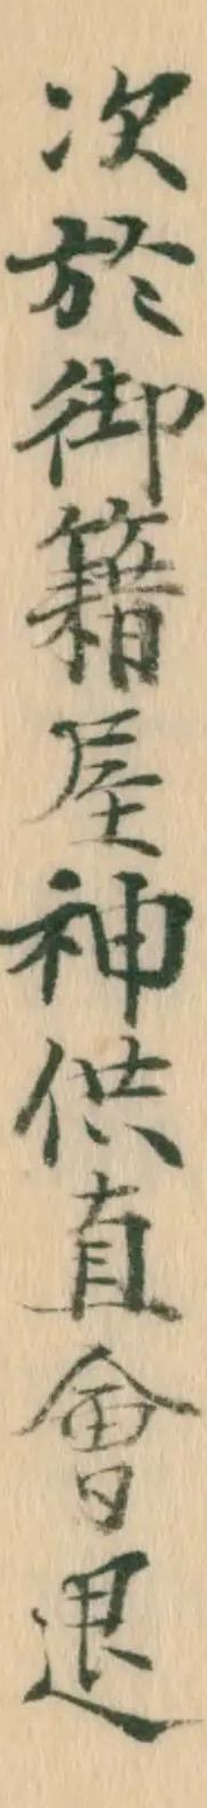次於御籍屋神供直会退
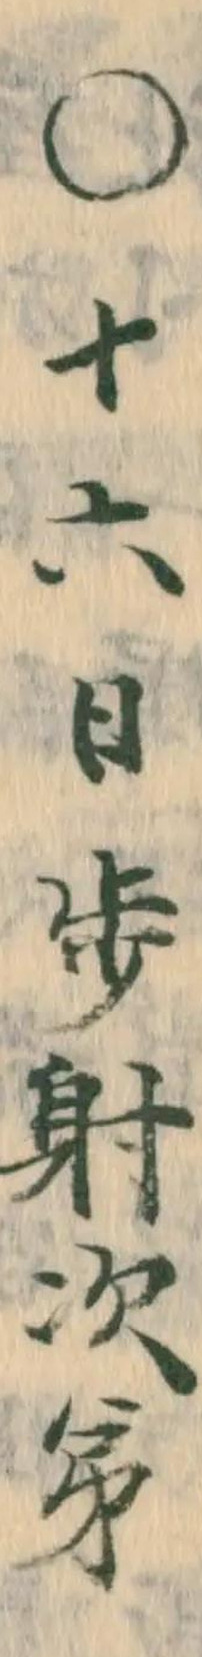○十六日歩射次第
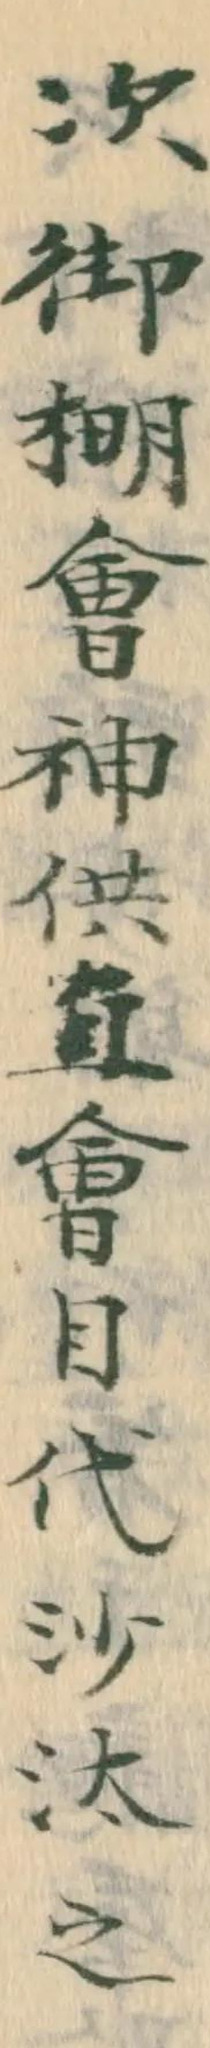次御棚会神供直会目代沙汰之

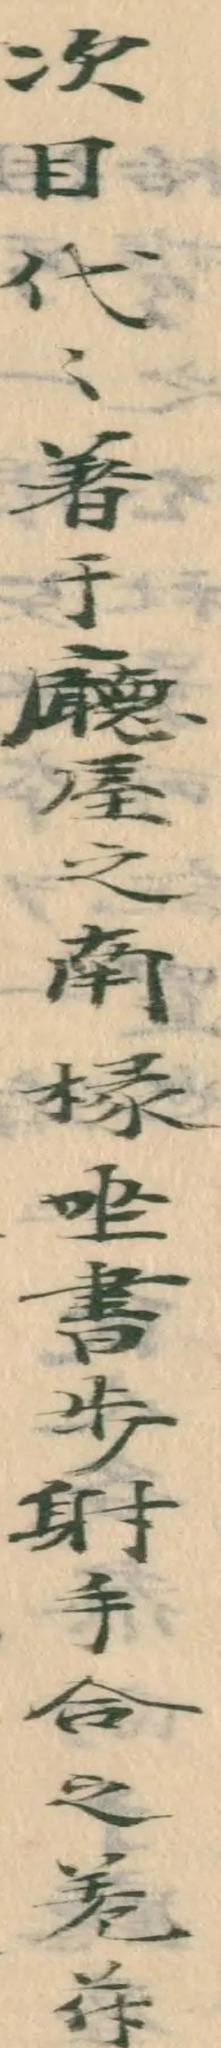次目代々着于庁屋之南椽坐書歩射手合之差符

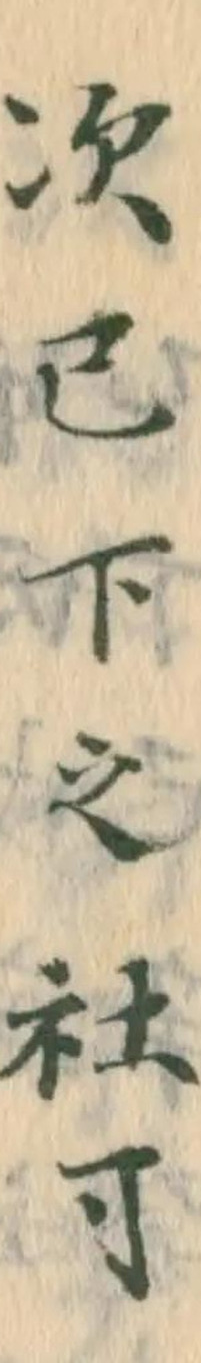次已下之社司

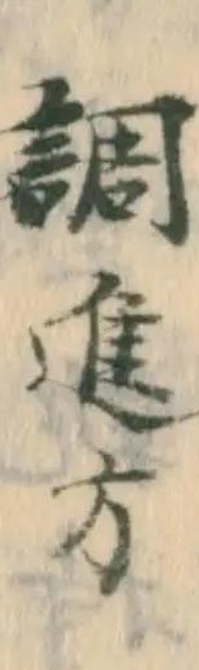調進方
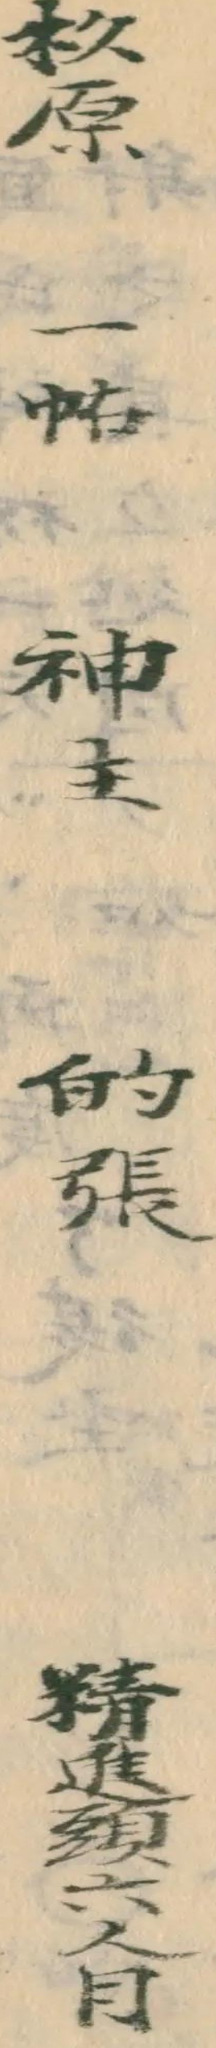杉原一帖神主的張精進頭六人目
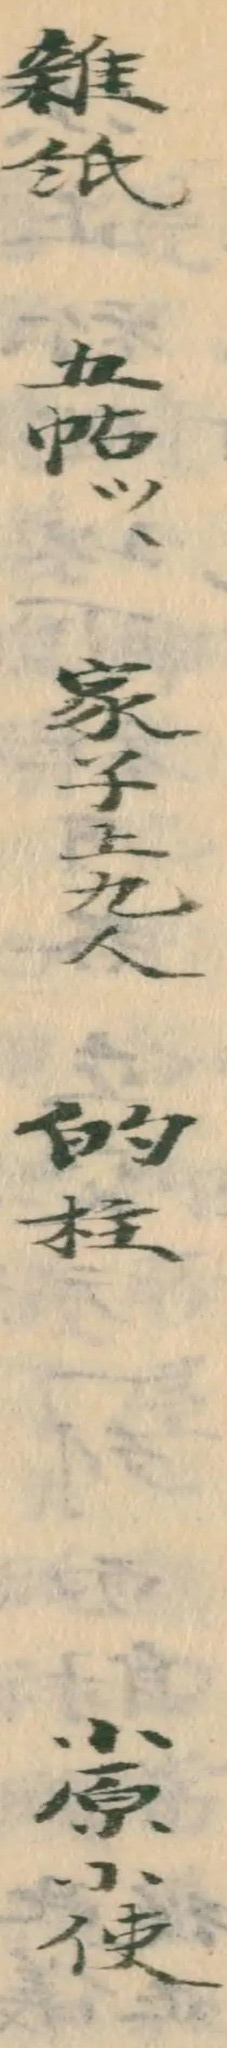雑紙五帖ツヽ家子上九人的柱小原小使
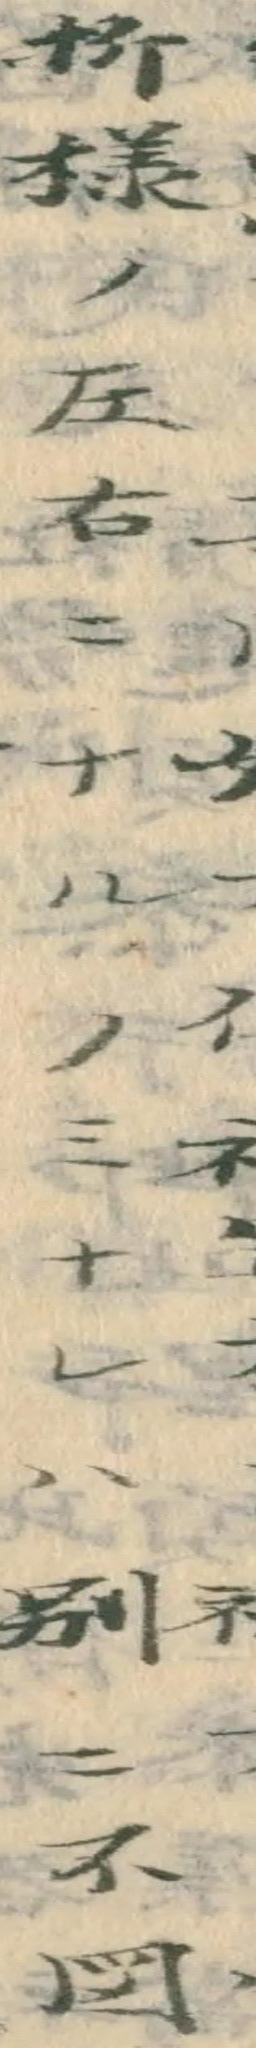折様ノ左右ニナルノミナレハ別ニ不図
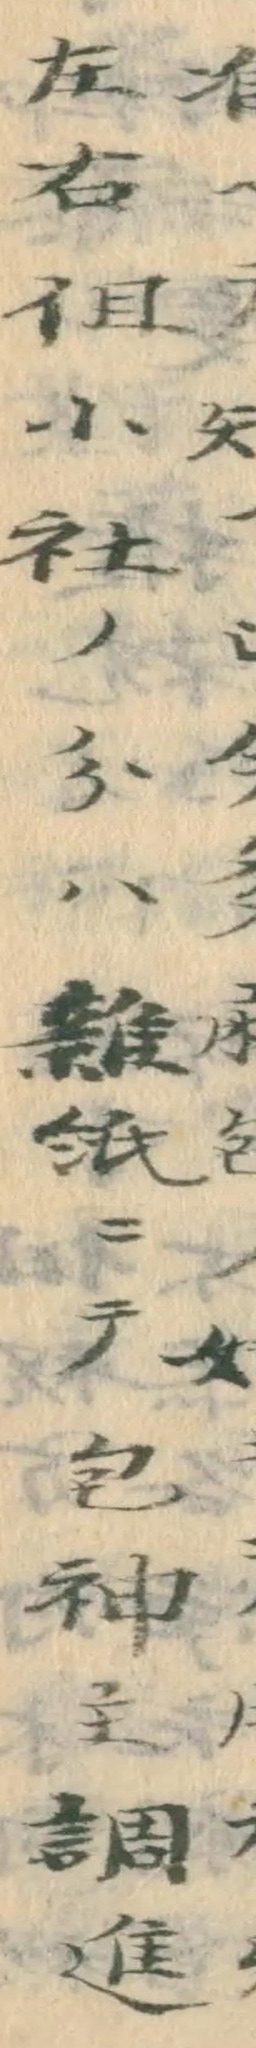左右但小社ノ分ハ雑紙ニテ包神主調進
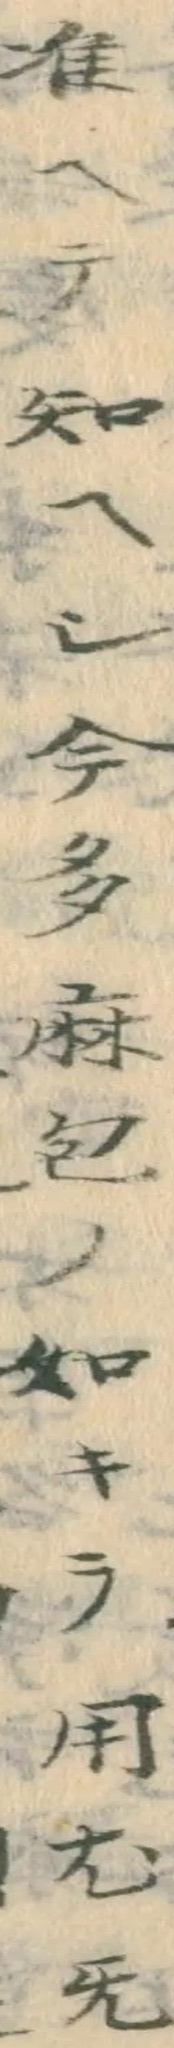准ヘテ知ヘシ今多麻包ノ如キヲ用尤無

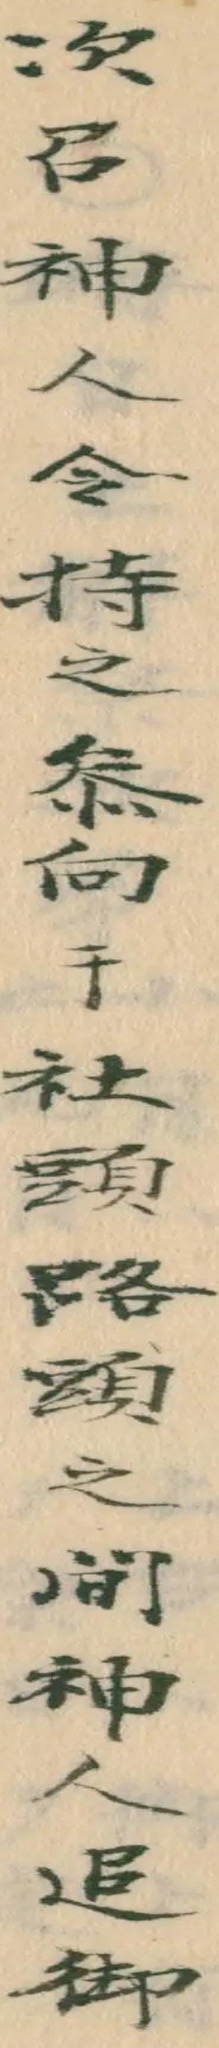次召神人令持之参向于社頭路頭之間神人追御
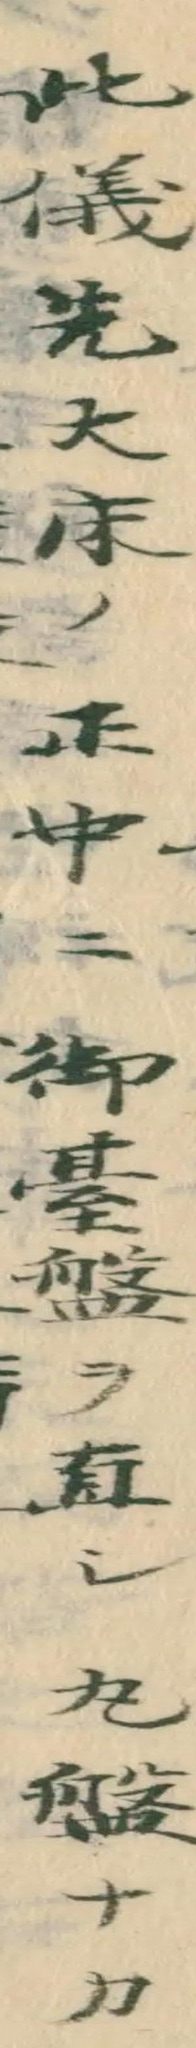此儀先大床ノ正中ニ御台盤ヲ直シ丸盤ナカ
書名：賀茂社記録. 第5冊
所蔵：国立国会図書館 National Diet Library, JAPAN
